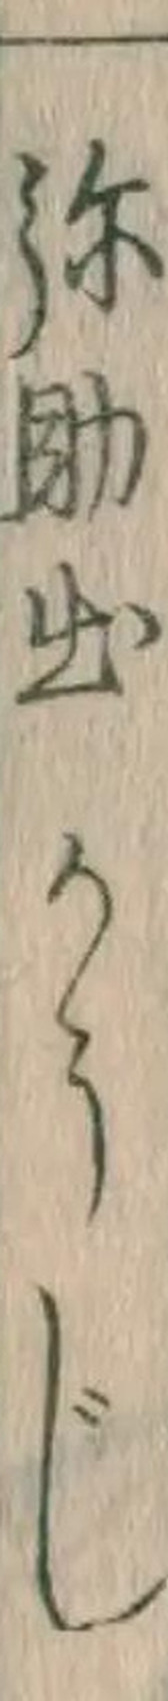弥助出かうじ
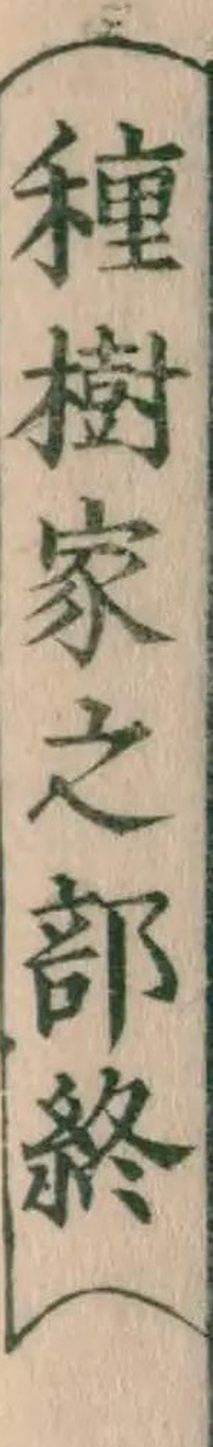種樹家之部終
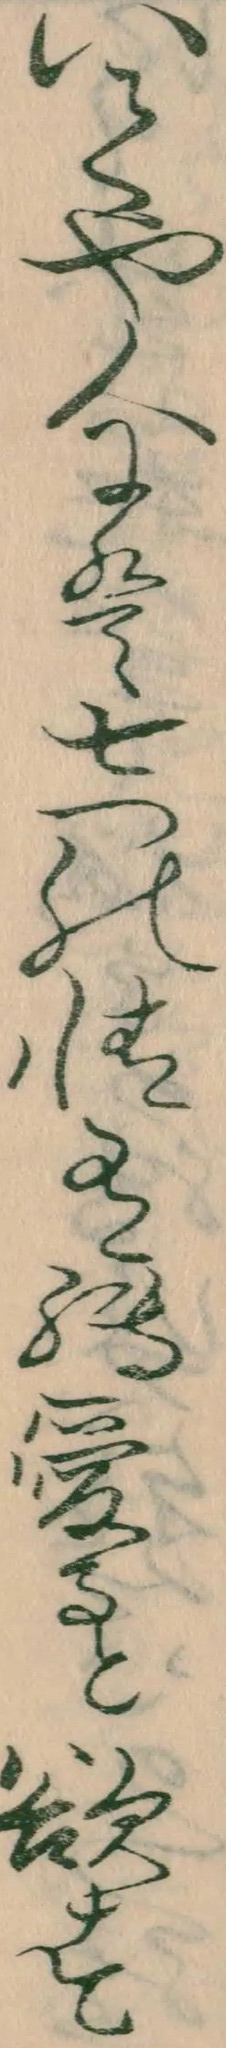いてや人には七つの情有て愛ると欲す
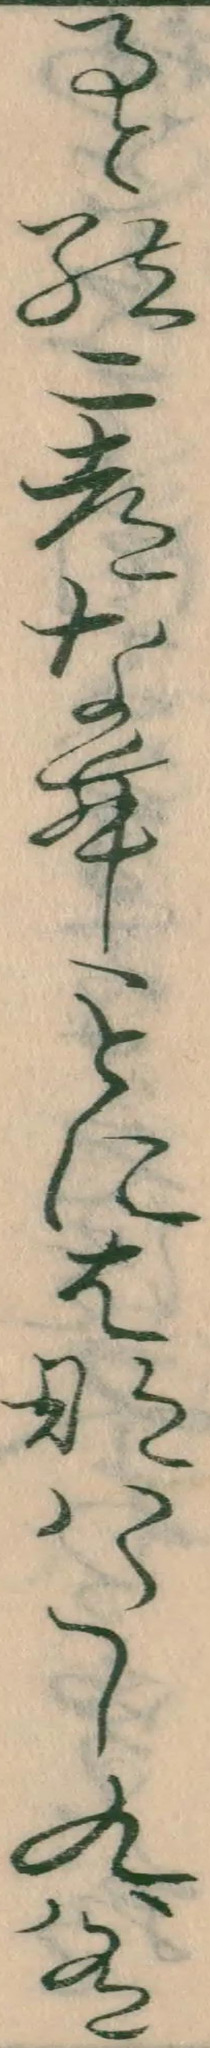るとの二つなむことにはなはたしくは有
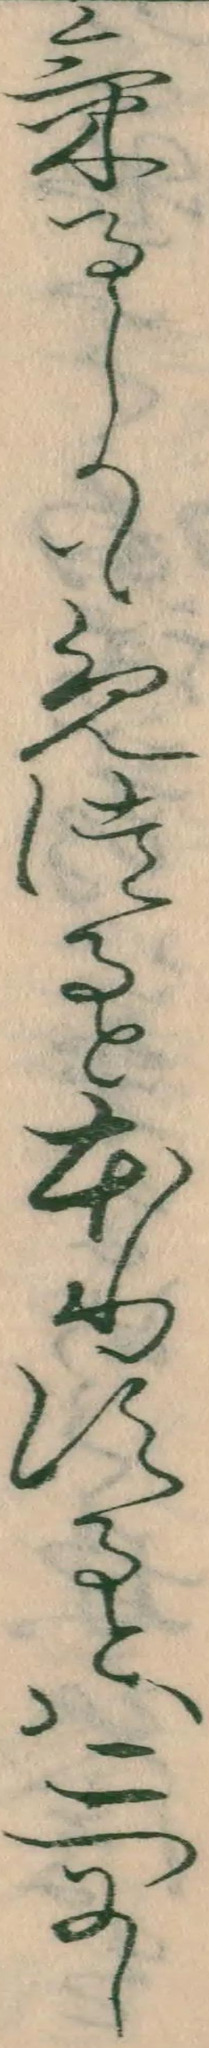けるしかもめつるとほりするとは二つにし
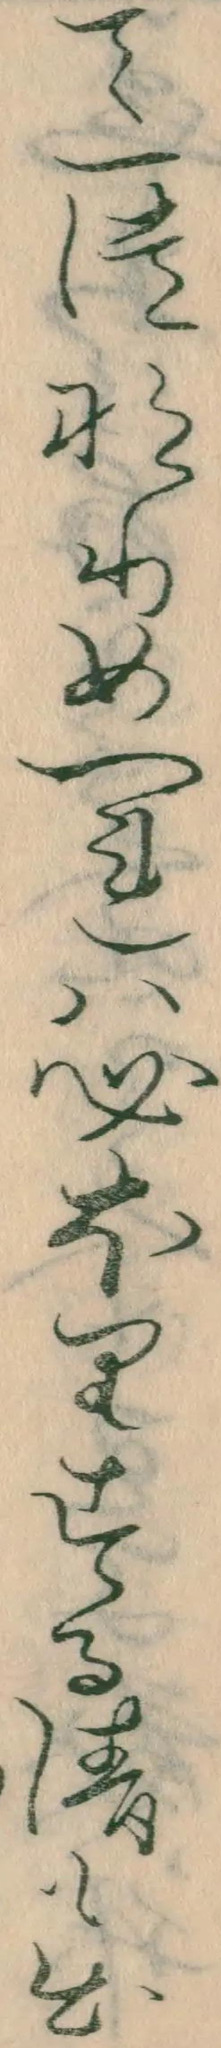て一つなりめつれは必ほりする情も出
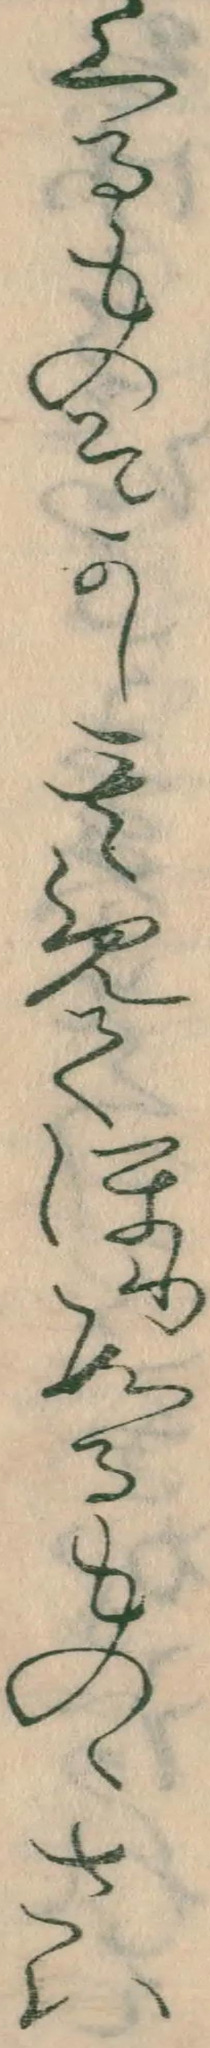くるものそかし其めてほりするものゝさい
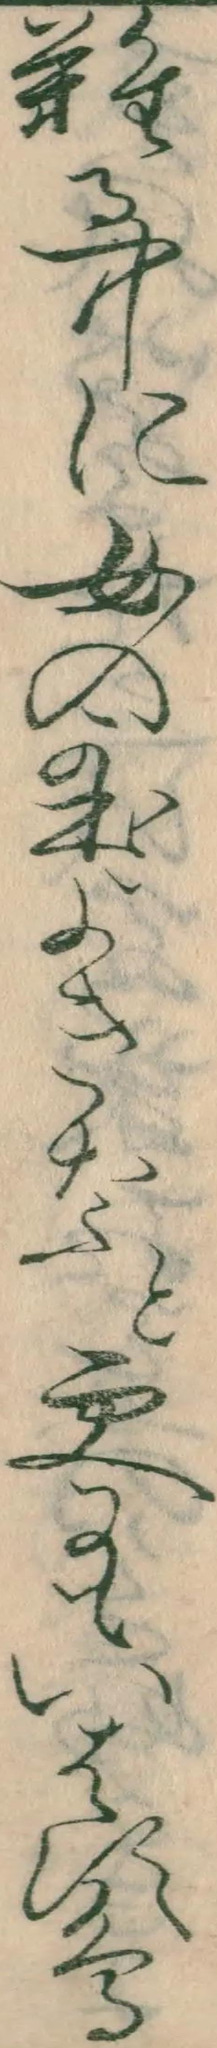なる中に女のかほよきなと更にもいはす鳥
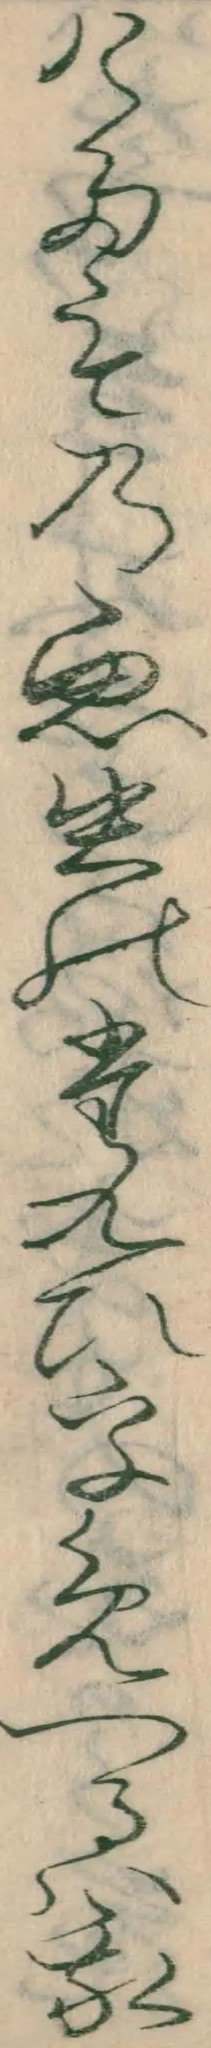けたもの魚虫のたくひをめつるは我
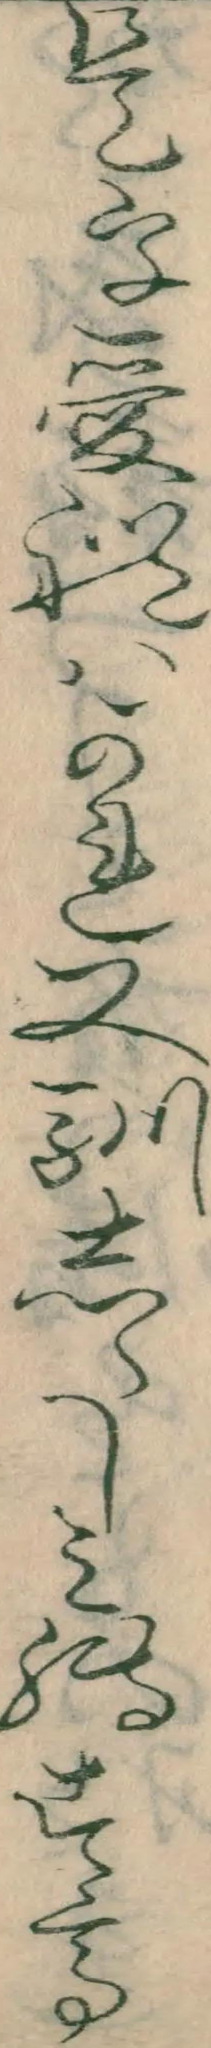是を愛れはかれ又馴したしみてすて

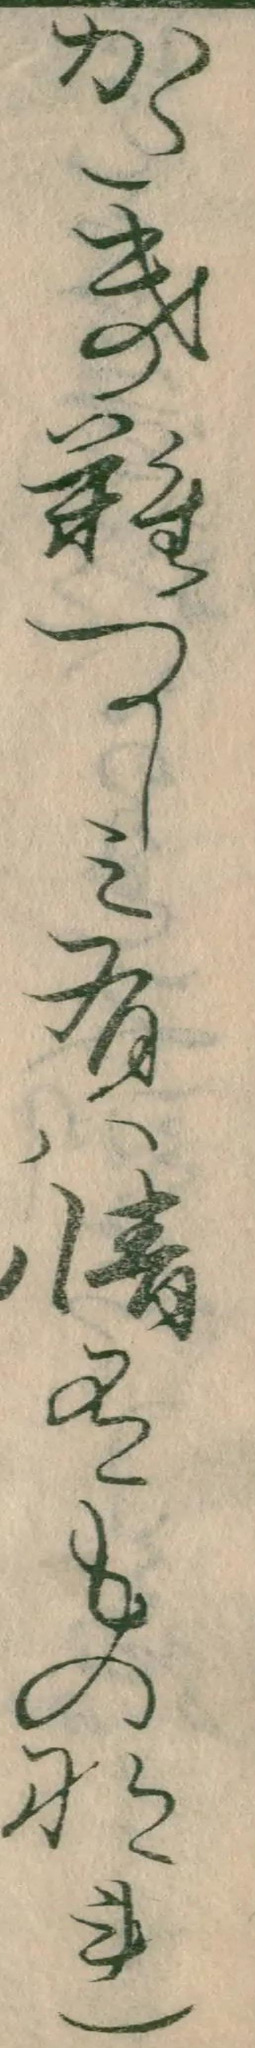かたきなつかしみ有は情有ものなれ
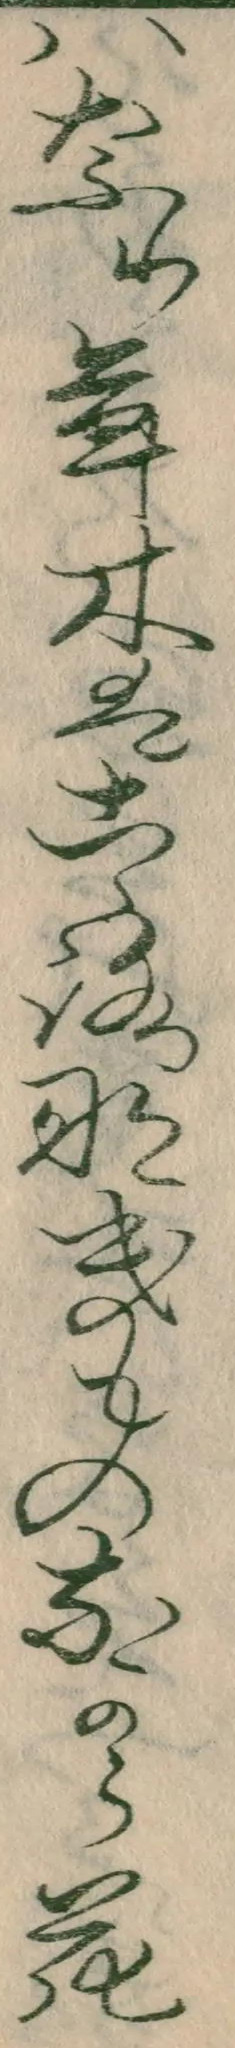はなり草木はこころなきものなから花
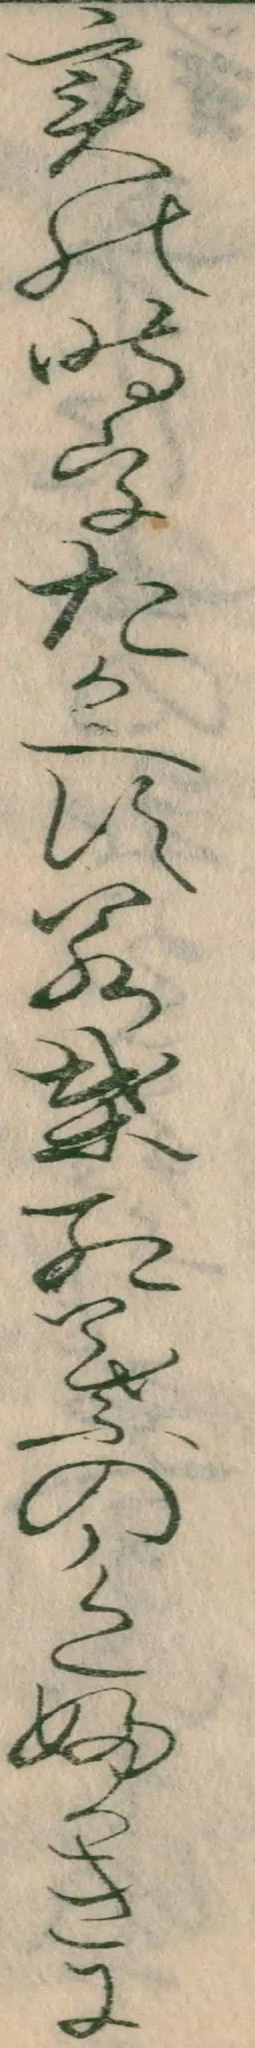実の時をたかへす若葉紅葉の色ふかきに
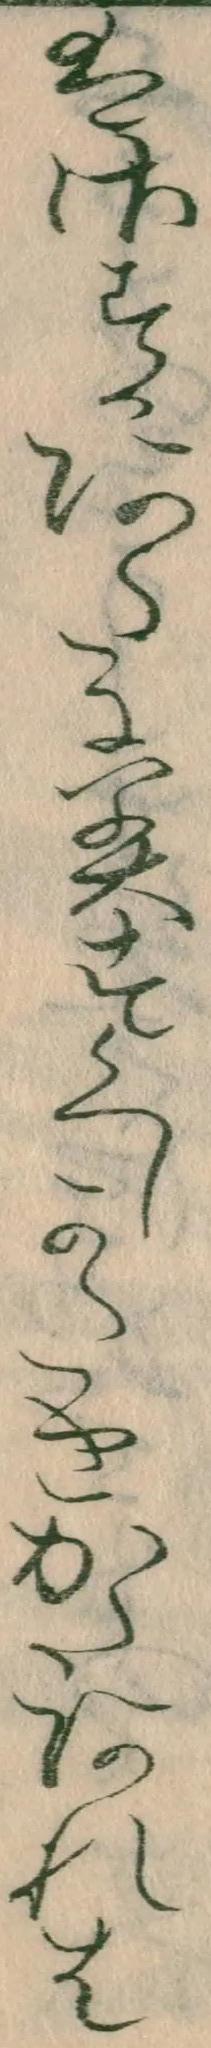はさすかあたにみすくしかたきかたあれは
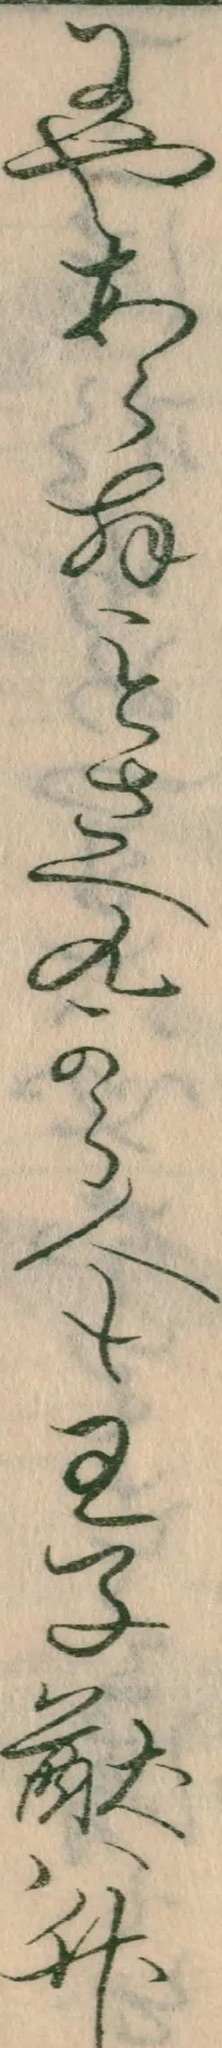にやあらむことさへくから人も王子猷は竹
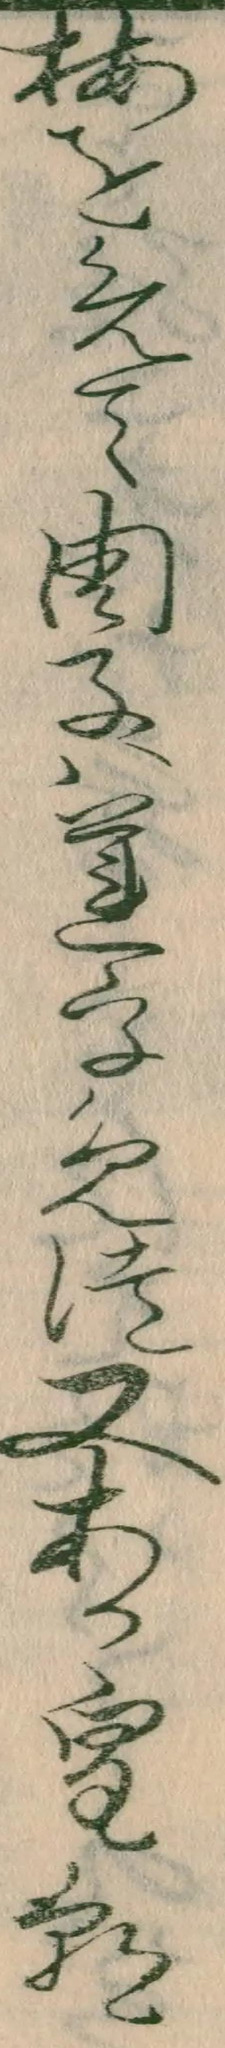梅をめて周子は蓮をめつ又あか皇朝
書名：草木奇品家雅見 3巻. [3]
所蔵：国立国会図書館 National Diet Library, JAPAN
